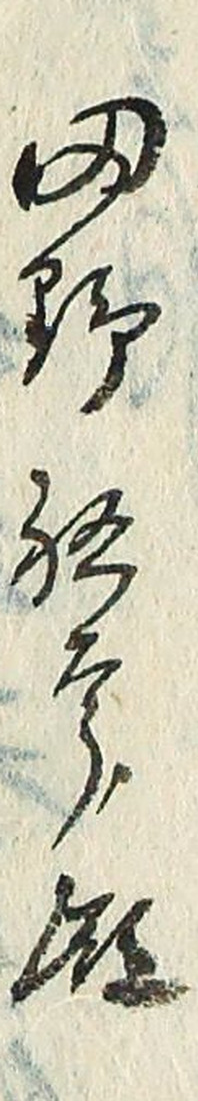田野祐太郎殿
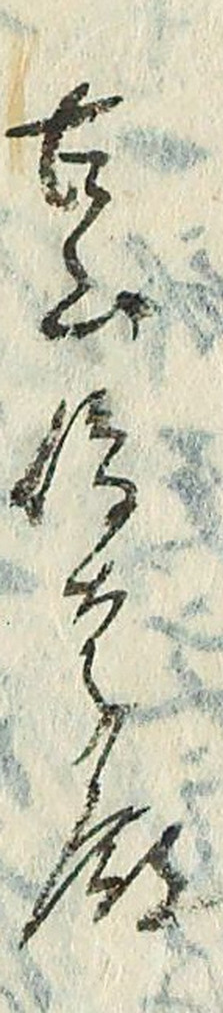古山僧太郎殿
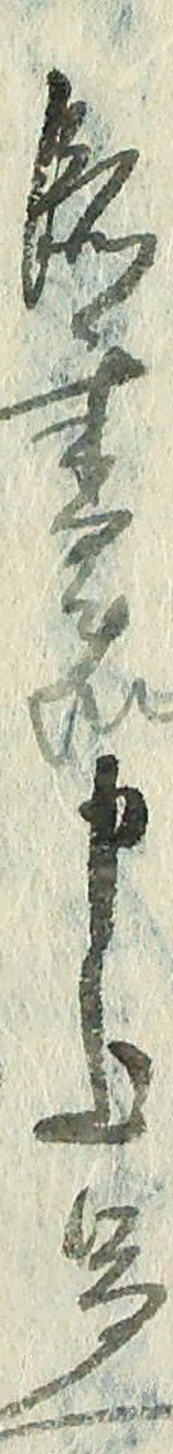添書を以申上覚
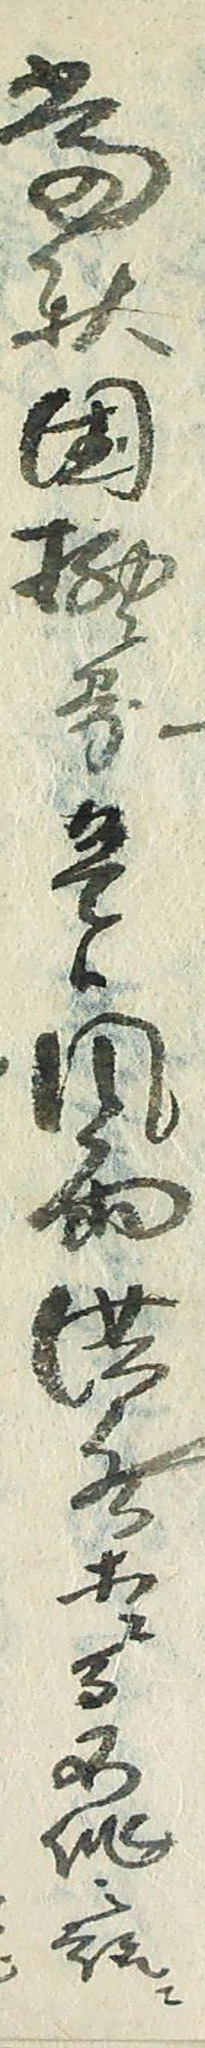当秋国柄に寄候ては風雨洪水等に而不作之趣に
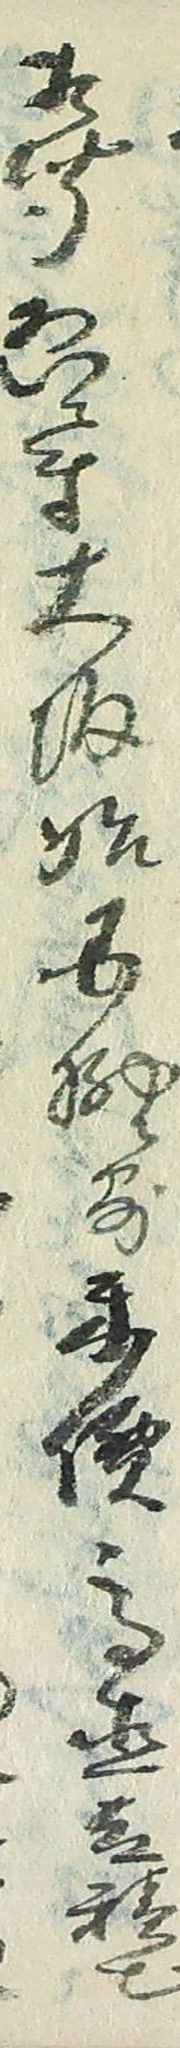相聞右に付大坂始国柄に寄米価高直故積出
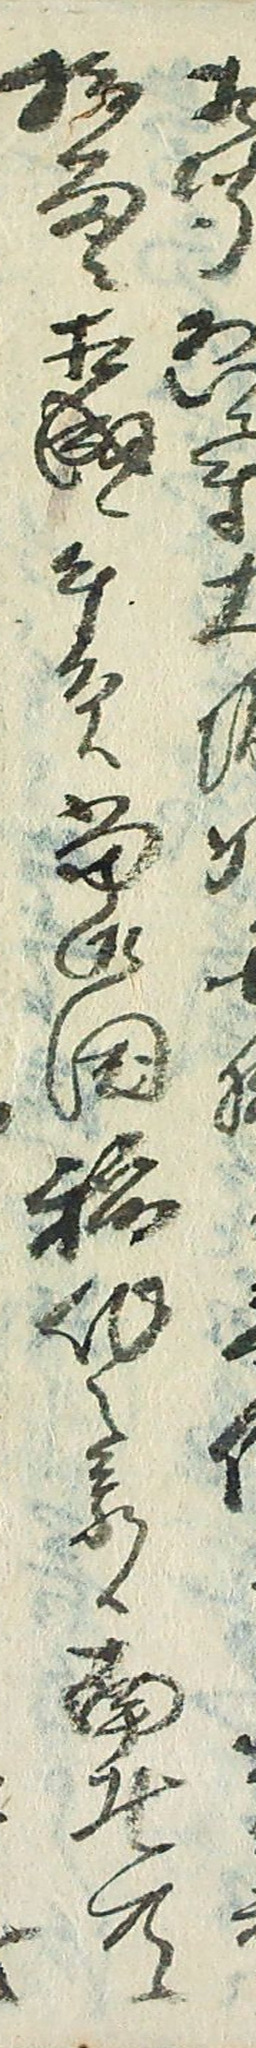指留に相成候付而は当御国稲作之義は南北共に
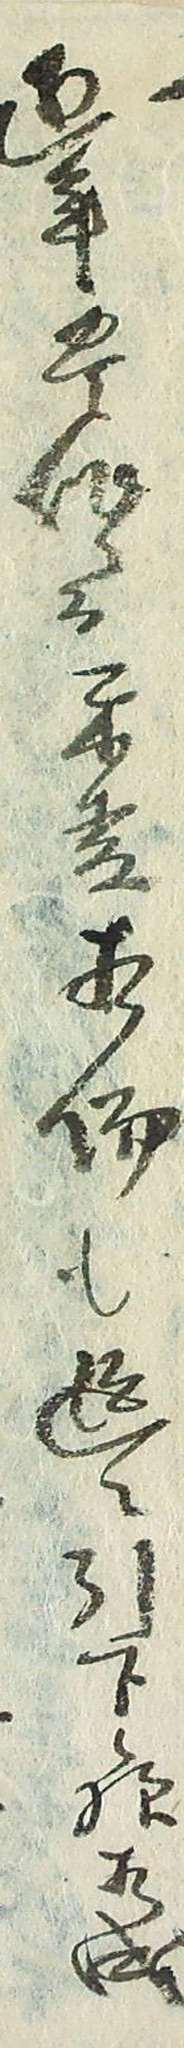近年豊作に而米麦相場も追々引下候様相成
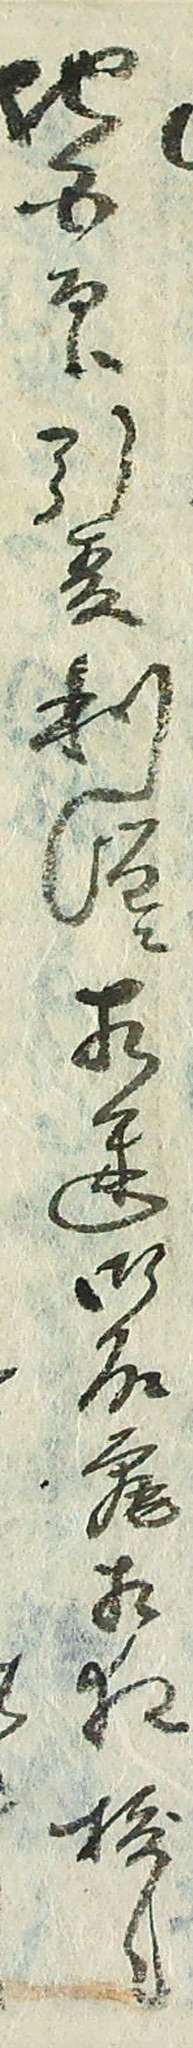他国而は引麦利潤に相迷御取究相犯抜て
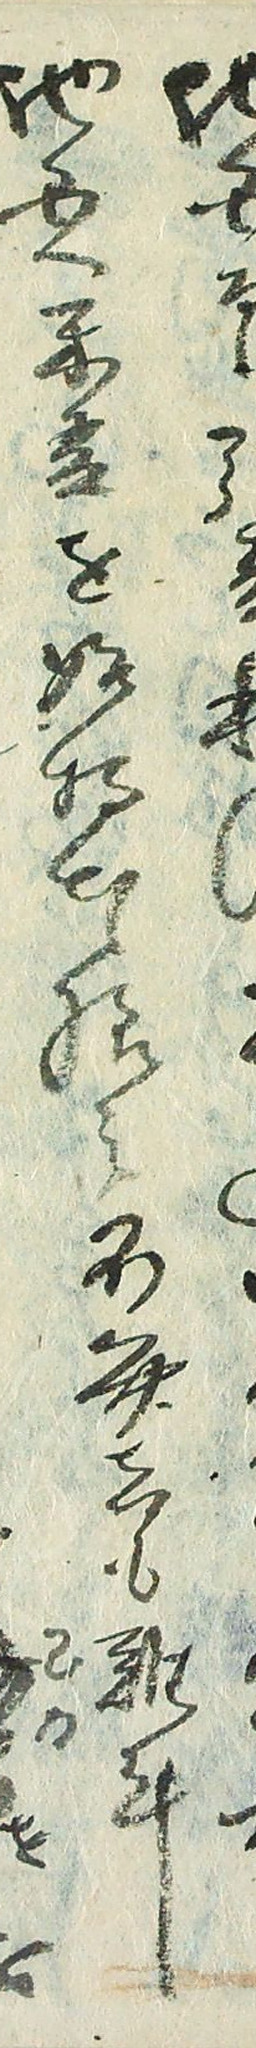他国へ米麦を始持出候様之不弁者も難計
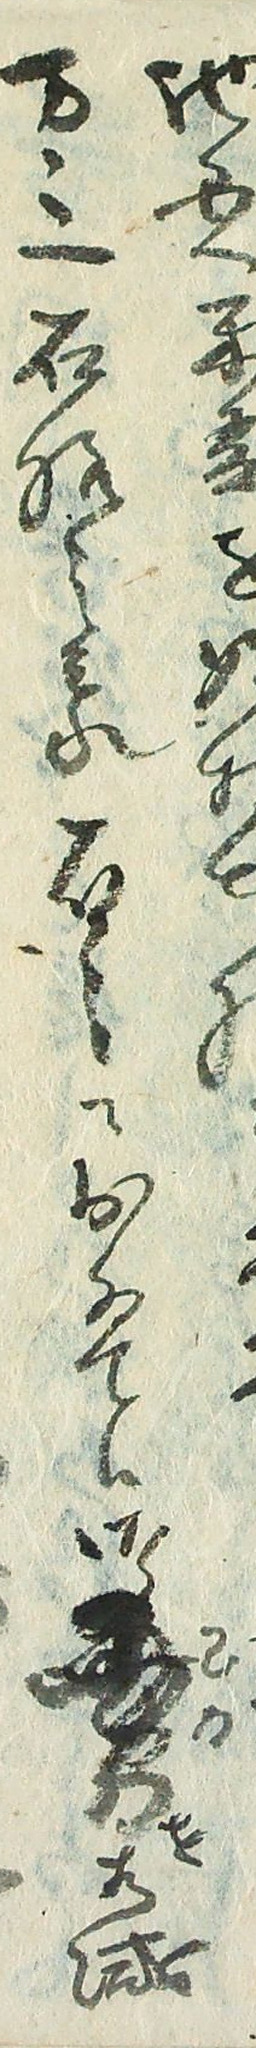万々一右様之義有之におゐては御国力を相減
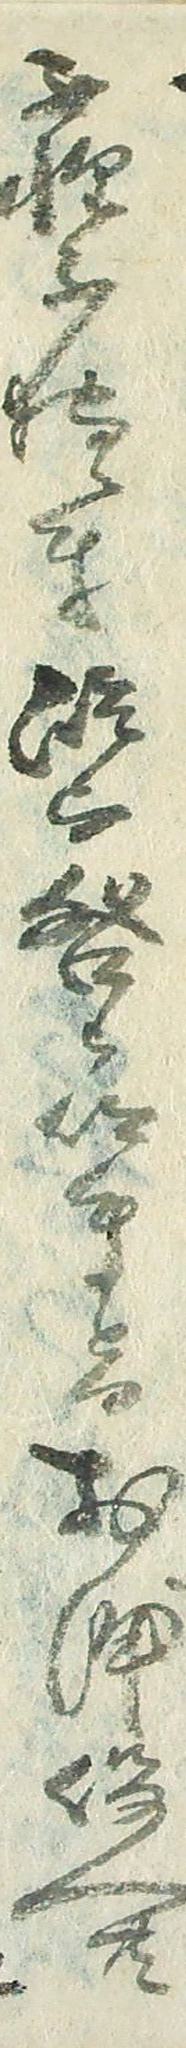不軽不埒に付屹と咎被仰付旨村浦役人共
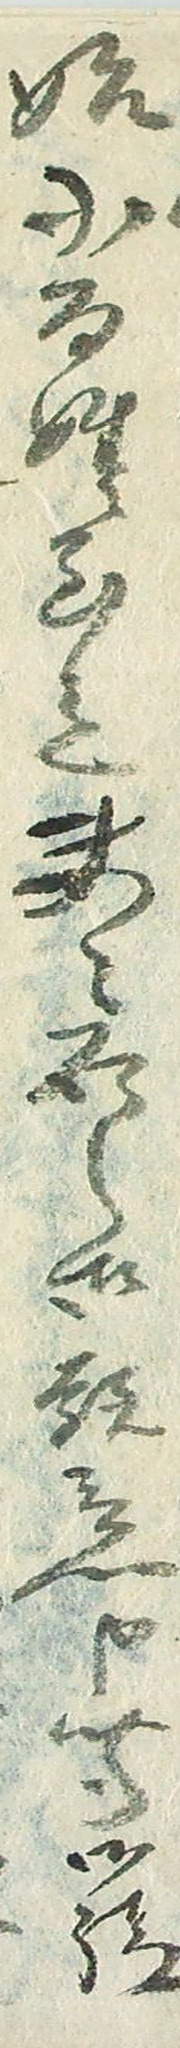始小百姓に至迄夫々右之御趣意申聞御請
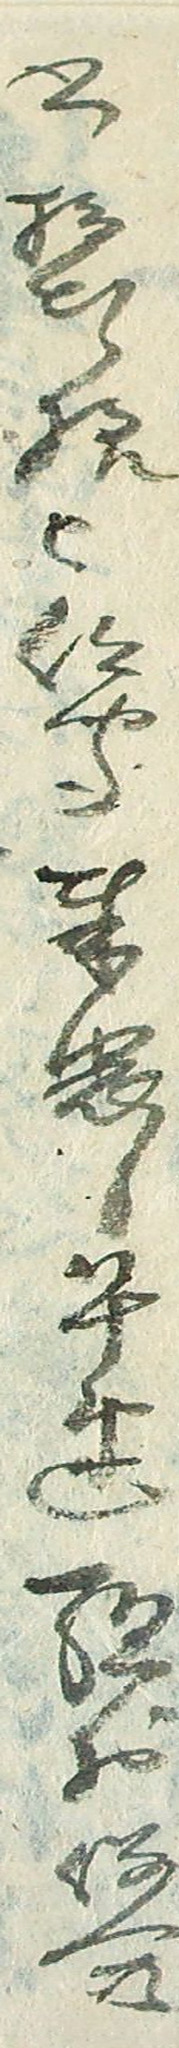書指出候様被仰聞奉畏早速組村役人共
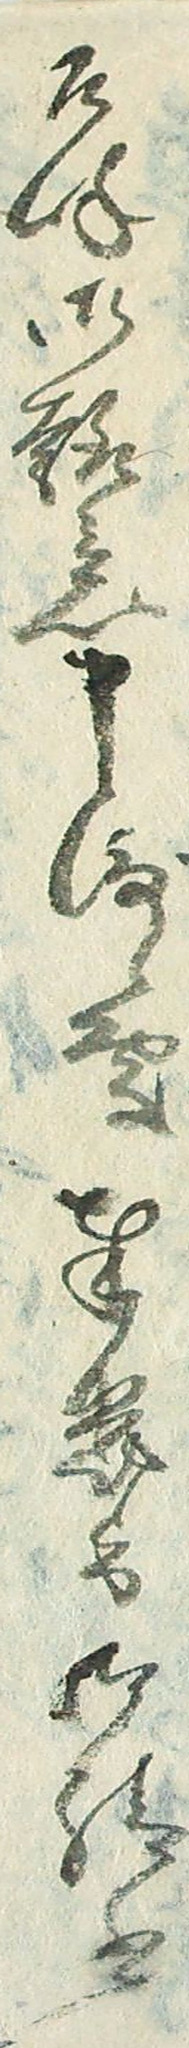召呼御趣意申渡候処奉畏旨御請書

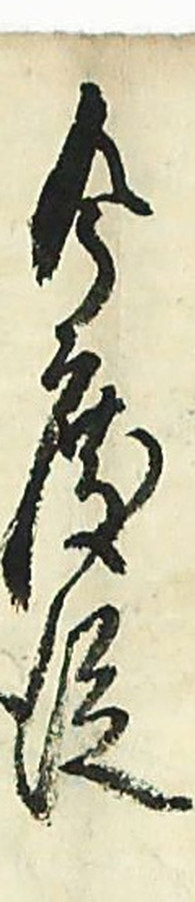今度従
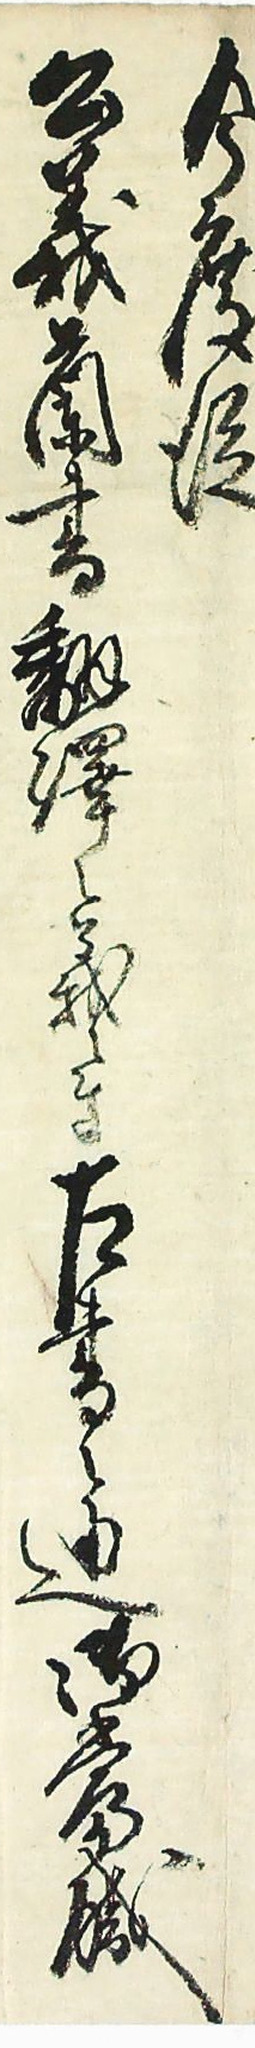公義蘭書翻訳之義に付左書之通御当職
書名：諸御用御□受書控
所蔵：鳴門教育大学 Naruto University of Education
